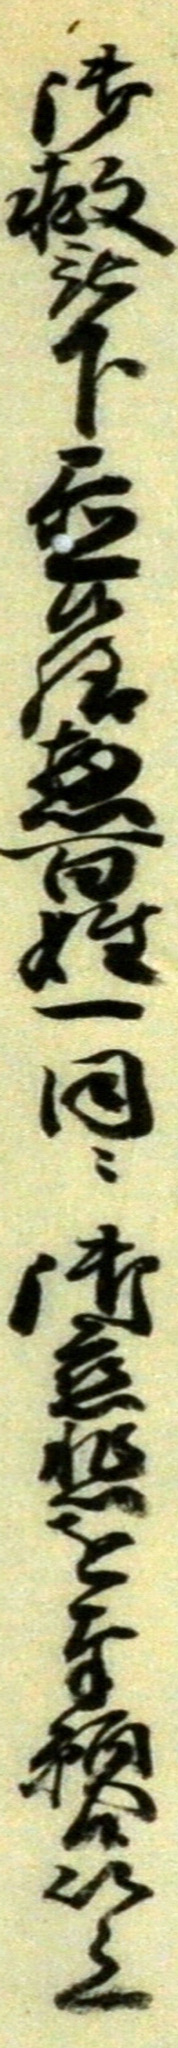御救被下置候様惣百姓一同ニ御慈悲を奉願候以上
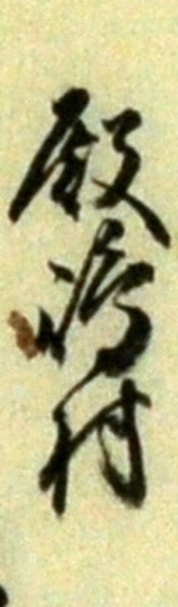殿嶋村
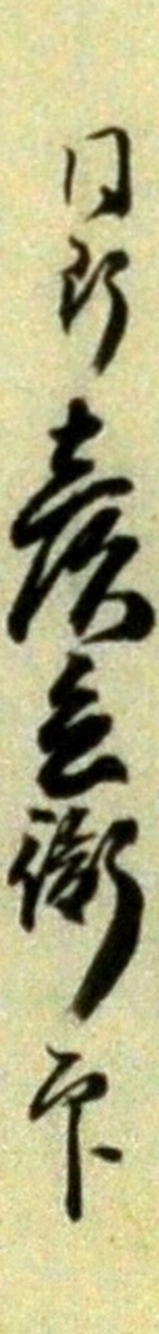同断彦兵衛印

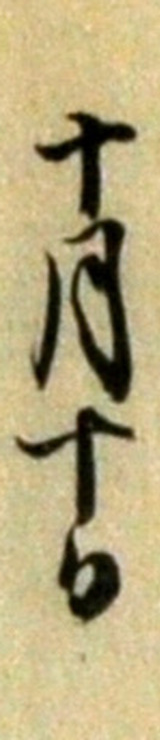十月十日
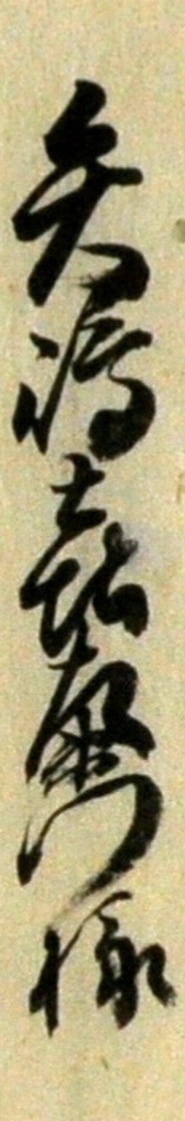矢嶋喜左衛門様
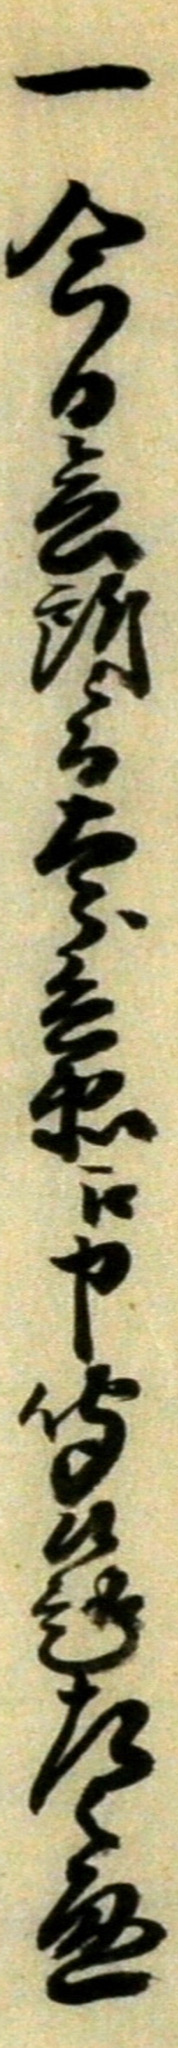一今日会所ニ而太郎兵衛江申聞候趣左之通
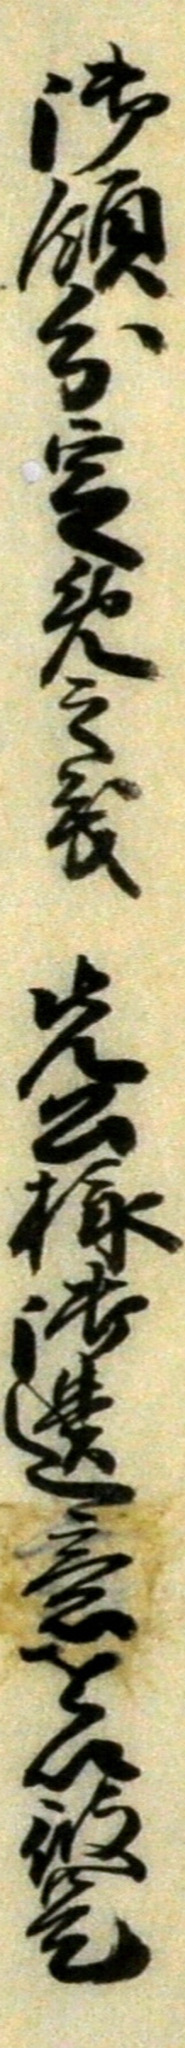御領分定免之義先公様御遺意を以彼是
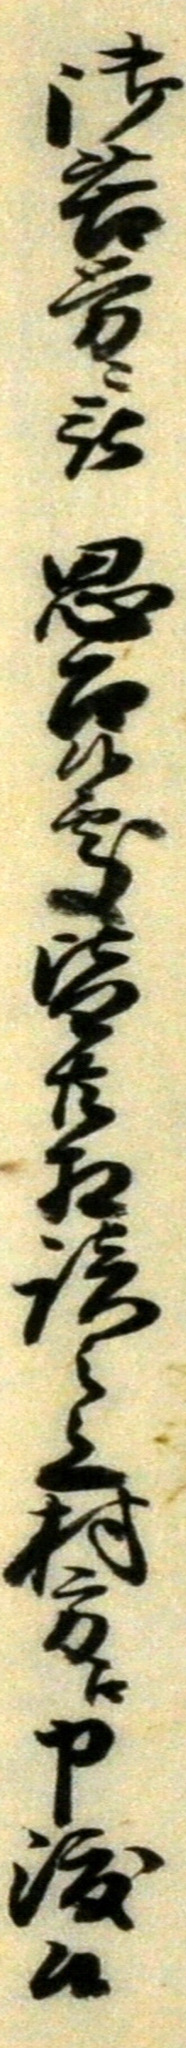御苦労ニ被思召候處皆共相談之上村方江申渡候
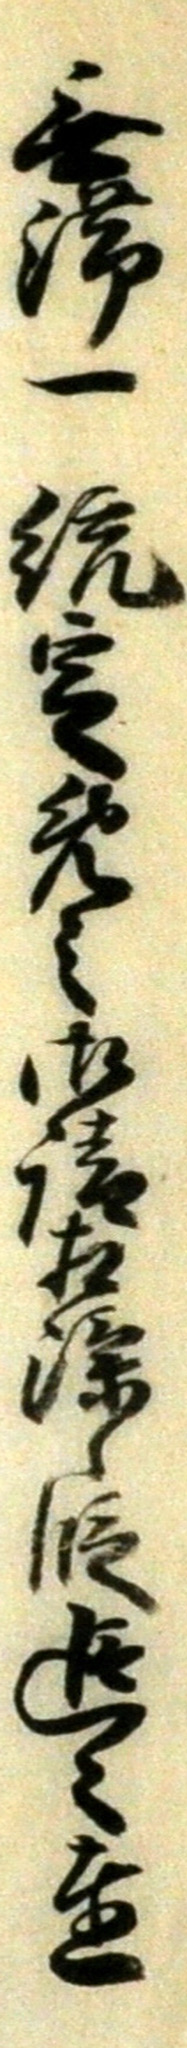無滞一統定免之御請相済候段追々達
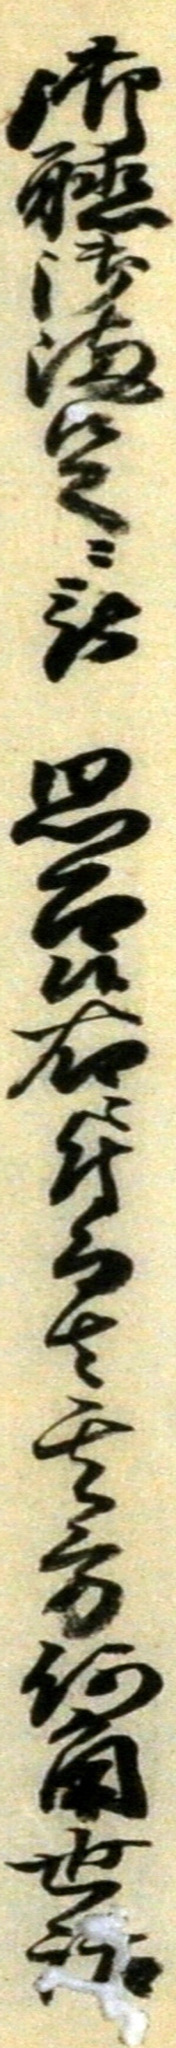御聴御満足ニ被思召候右ニ付而者其方何角世話
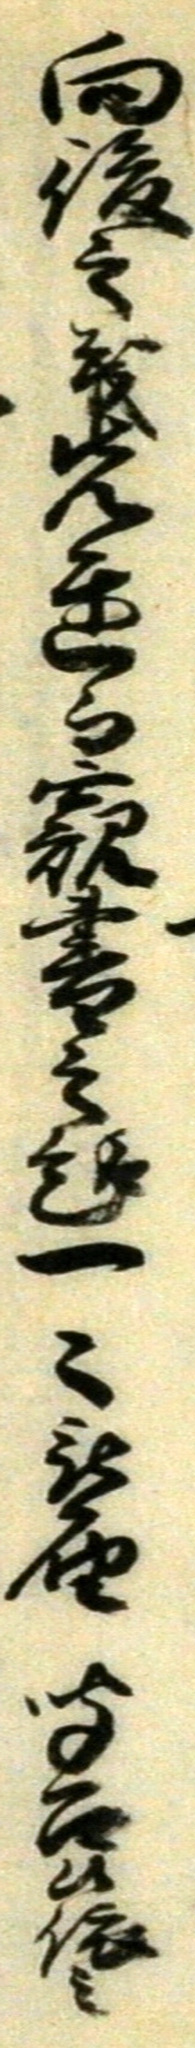向後之義先達而窺書之趣一々被届聞召候依之
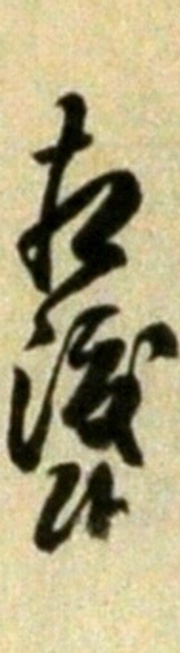相渡候
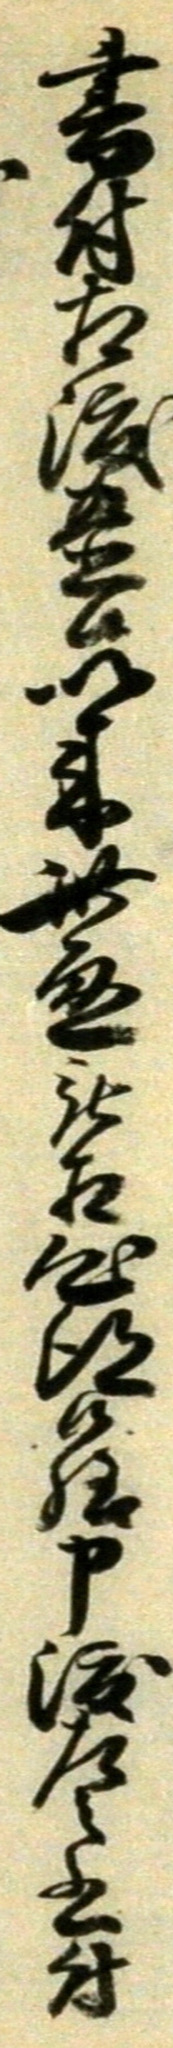書付相渡置候以来此通被相心得候様申渡左之書付
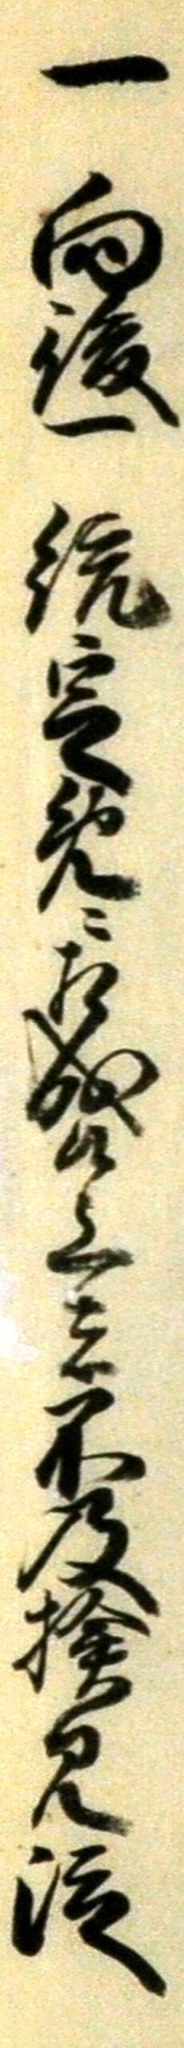一向後一統定免ニ相成候上者不及検見従
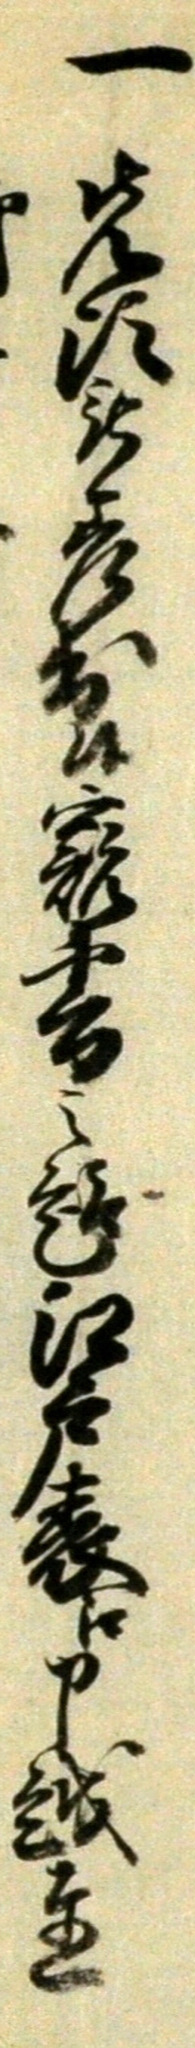一先頃被差出候窺書之趣江戸表江申越達
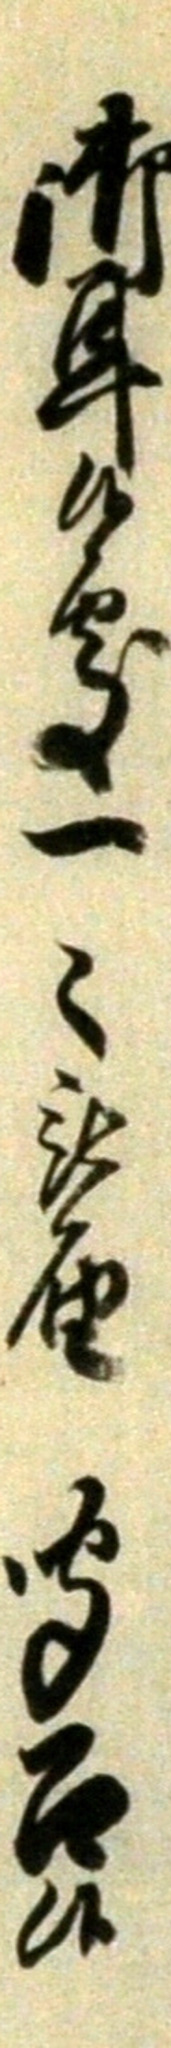御耳候處一々被届聞召候
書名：留書
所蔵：伊那市立高遠町図書館・合同会社AMANE
